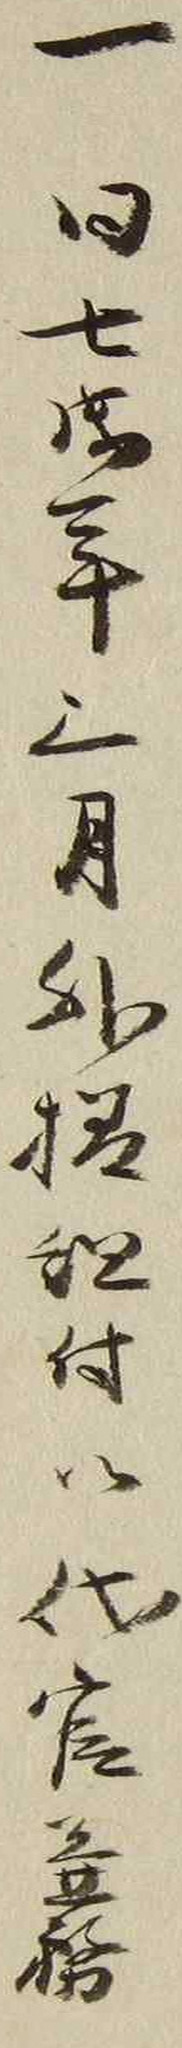一同七戌年三月外様組付御代官兼務
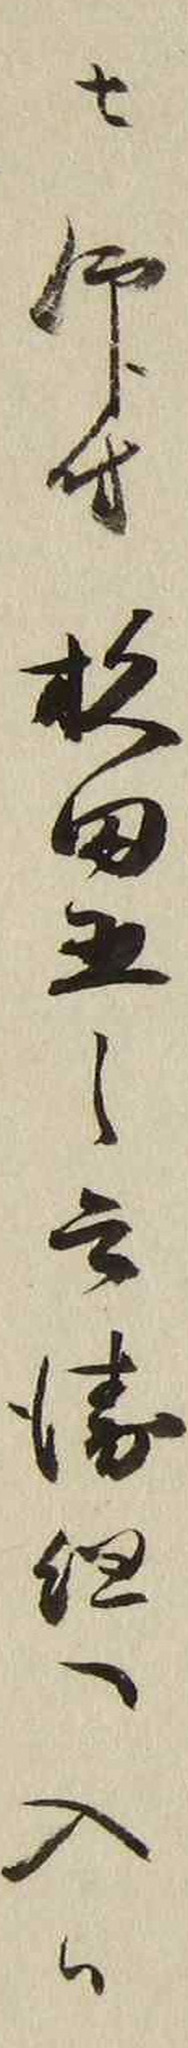被仰付杉田五郎兵衛組へ入候

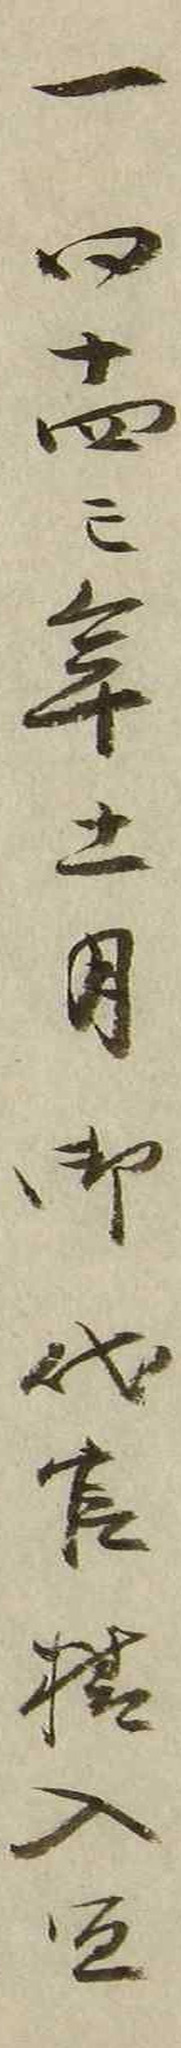一同十四巳年十一月御代官精入宜
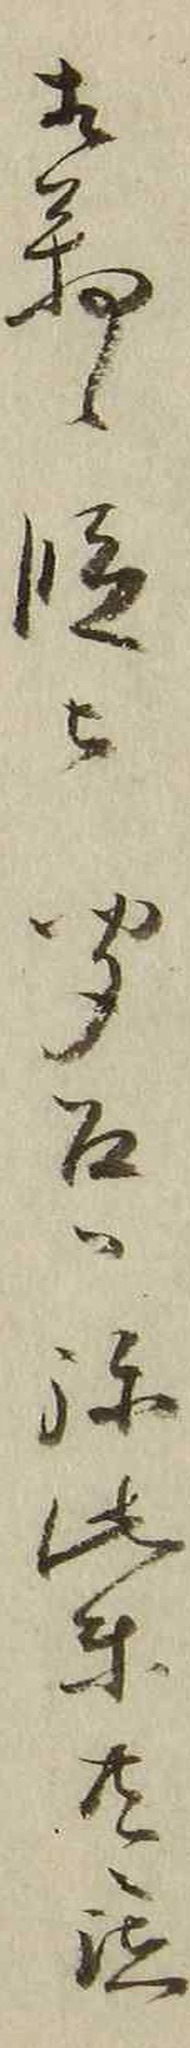相勤候段被聞召候弥此末共ニ諸
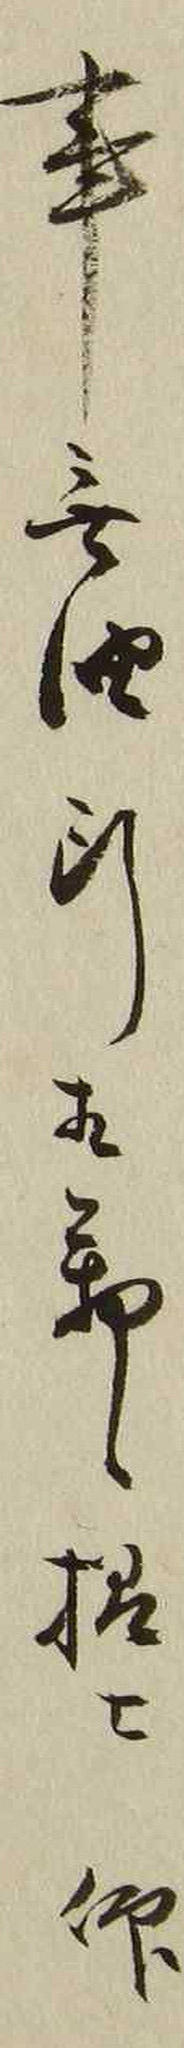事無油断相勤候様被仰
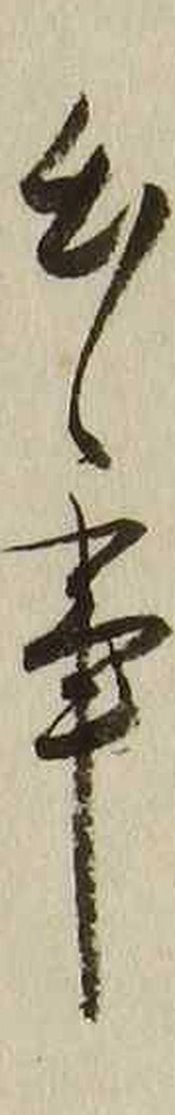出候事
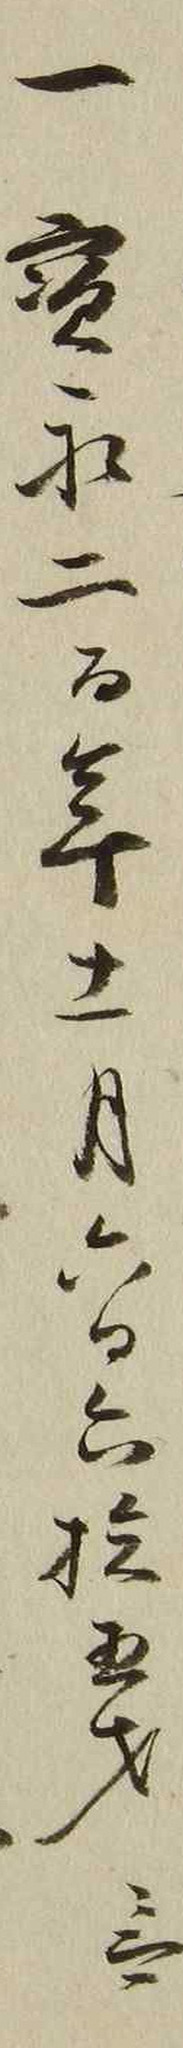一宝永二酉年十一月六日六拾五才ニ而
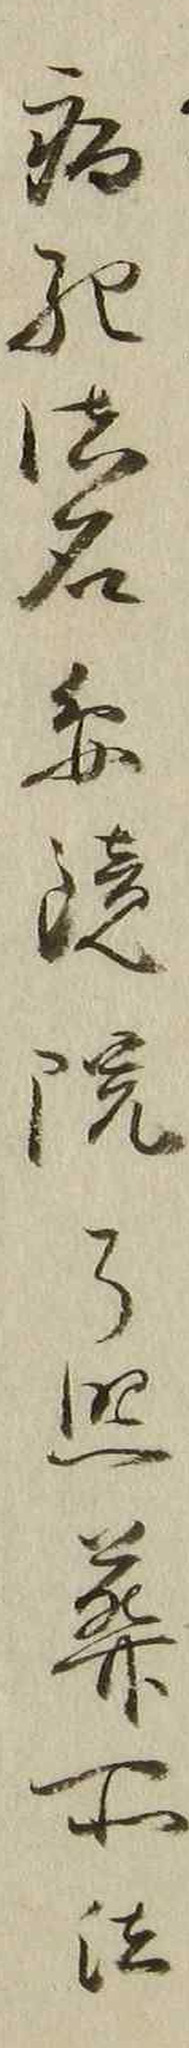病死法名円鏡院了照葬所法
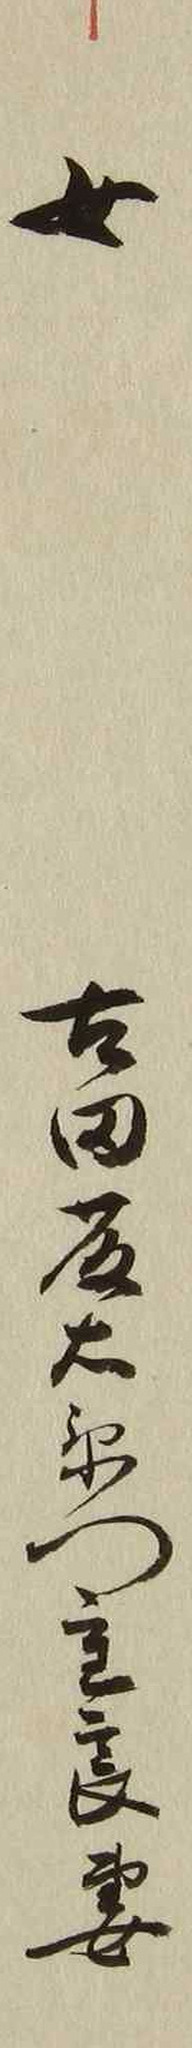女古田藤右衛門重良妻
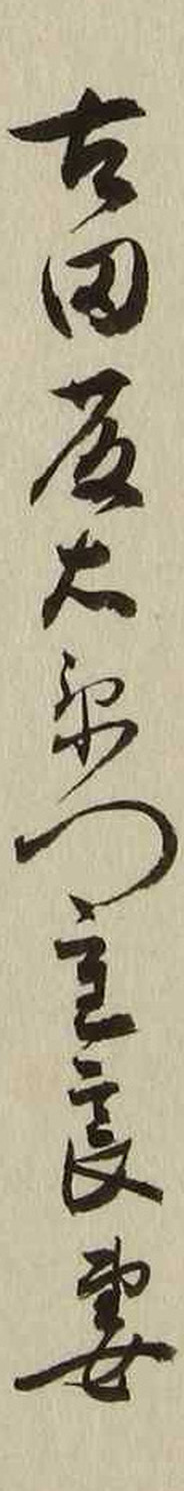女古田藤右衛門重良妻
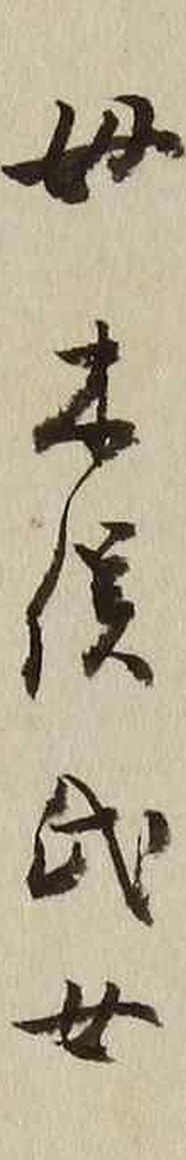母木俣氏女
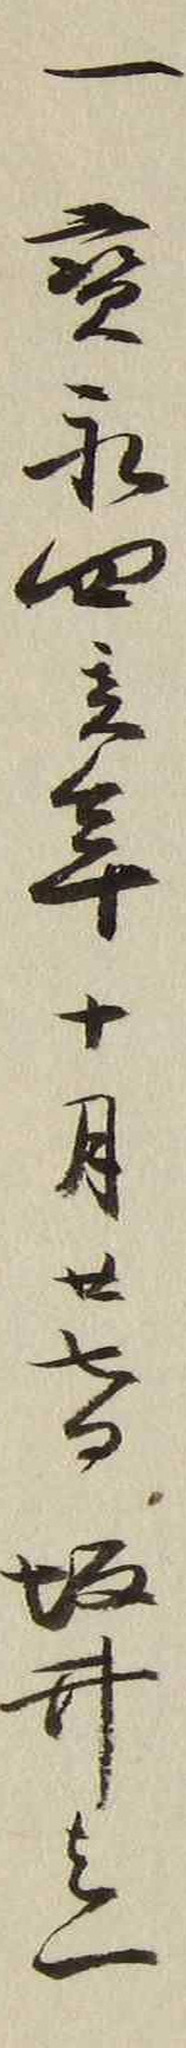一宝永四亥年十月廿七日坂井与一
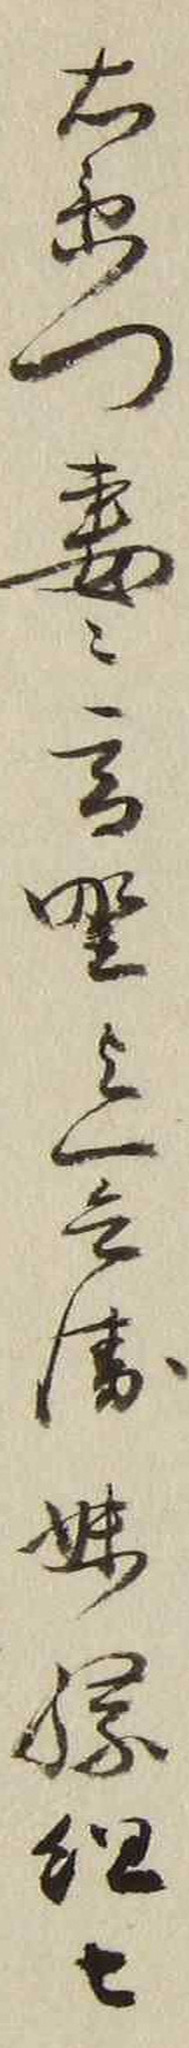右衛門妻ニ高野与一兵衛妹縁組被

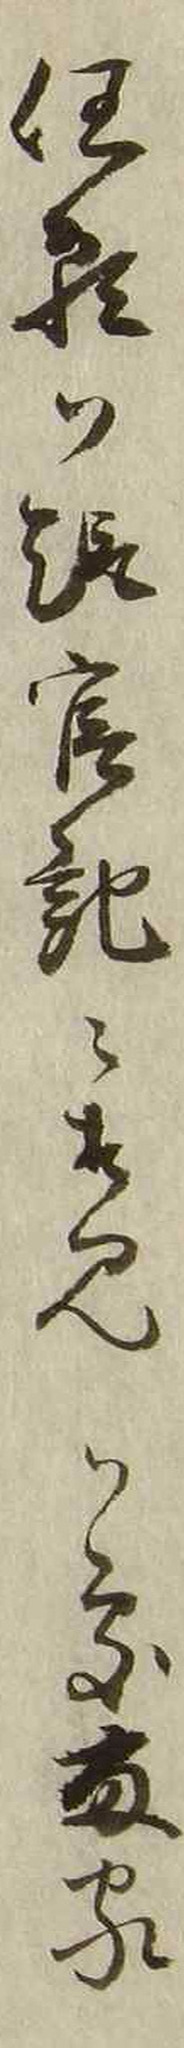任願候趣官記ニ相見候処両家
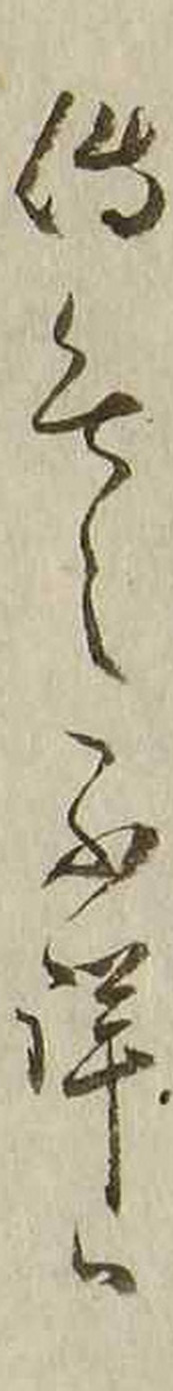伝無之不詳候
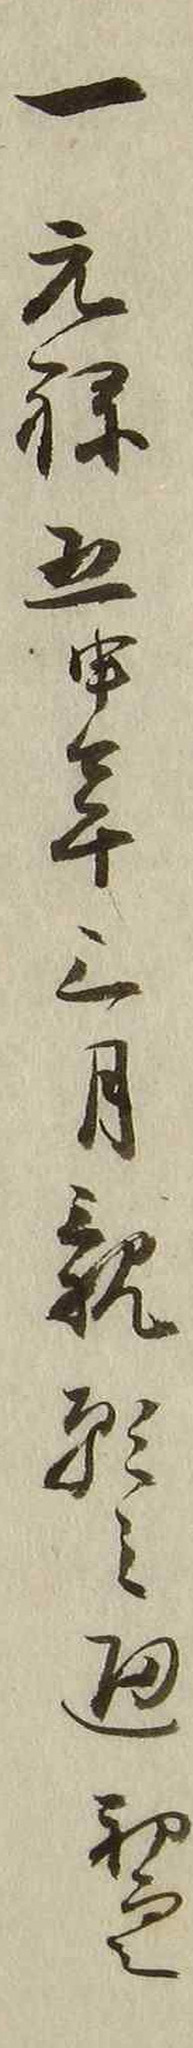一元禄五申年三月親願之通初而之
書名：諸士系譜　巻之288　さ之部20
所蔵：会津若松市立会津図書館
